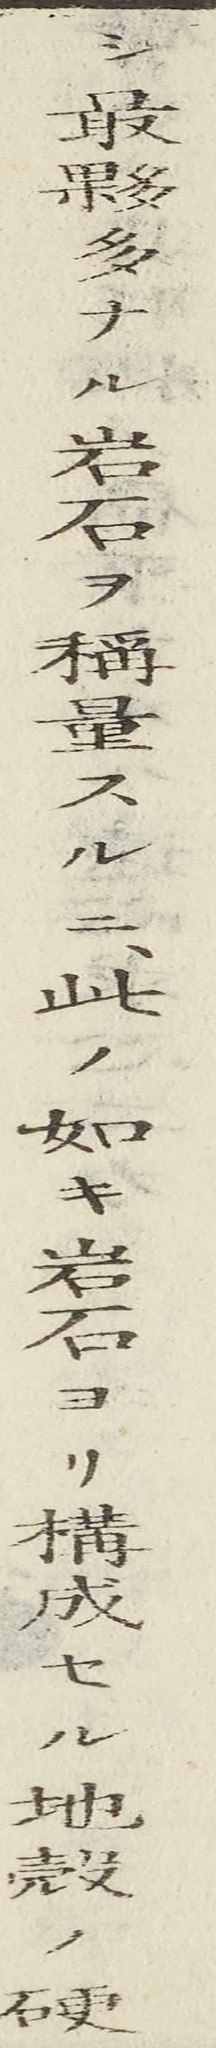シ最夥多ナル岩石ヲ称量スルニ、此ノ如キ岩石ヨリ構成セル地殻ノ硬
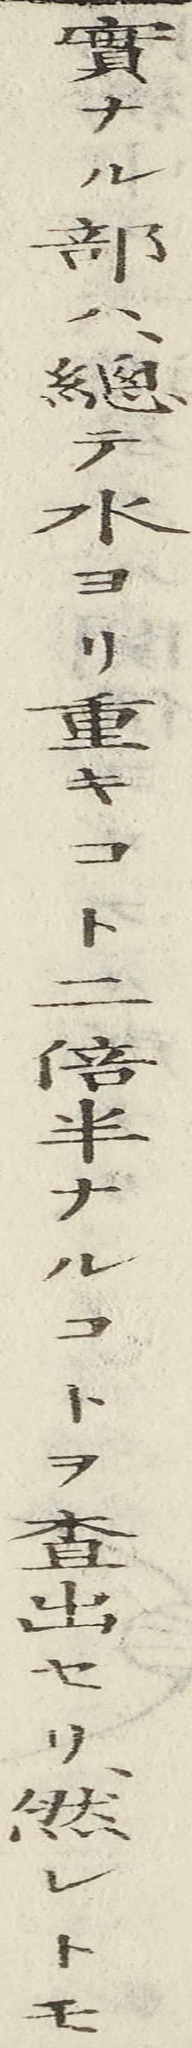実ナル部ハ、総テ水ヨリ重キコト二倍半ナルコトヲ査出セリ、然レトモ
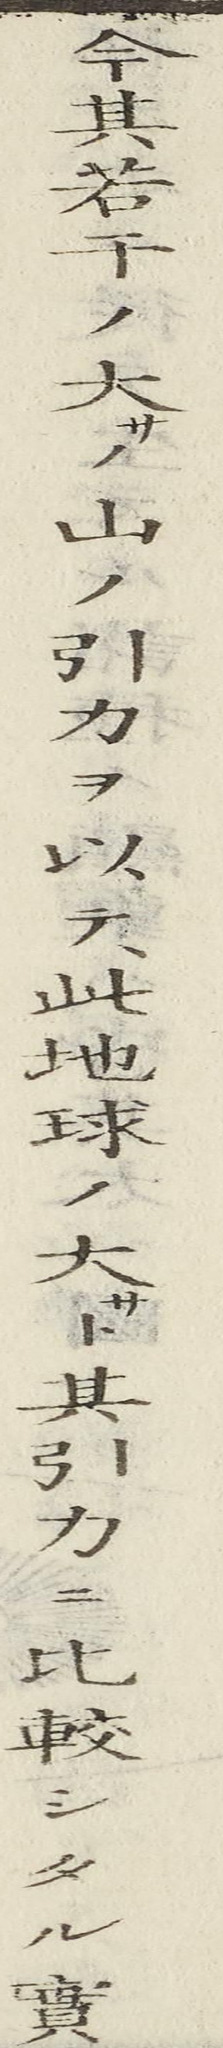今其若干ノ大サノ山ノ引力ヲ以テ、地球ノ大サト其引力ニ比較シタル実
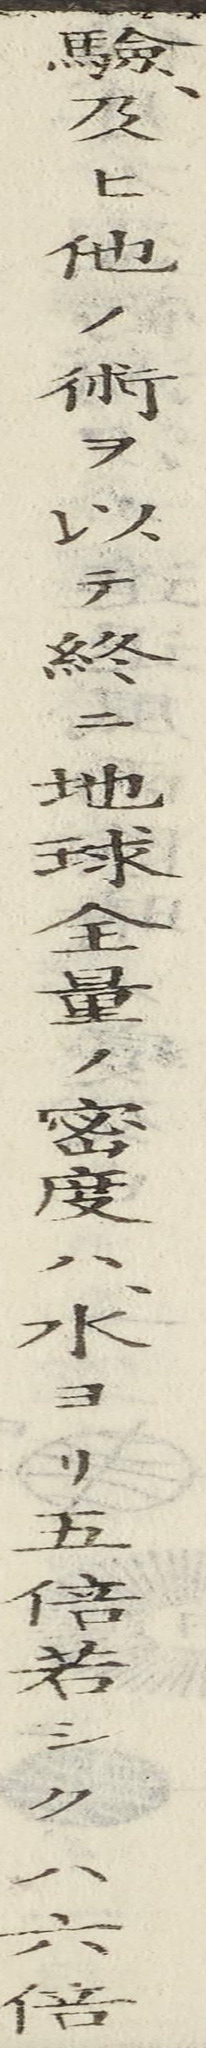験、及ヒ他ノ術ヲ以テ終ニ地球全量ノ密度ハ、水ヨリ五倍若シクハ六倍
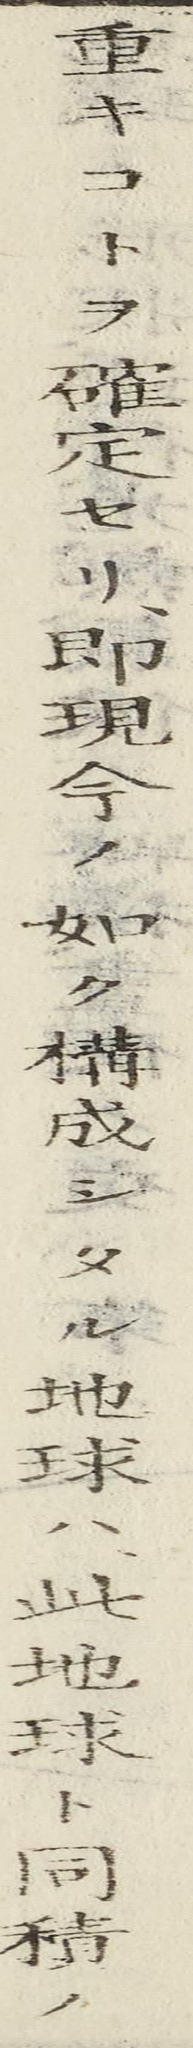重キコトヲ確定セリ、即現今ノ如ク構成シタル地球ハ、此地球ト同積ノ
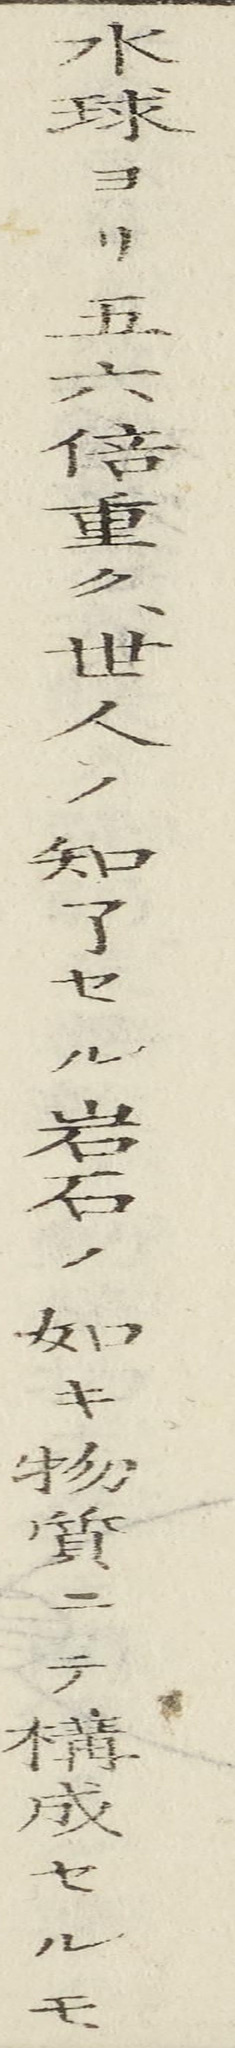水球ヨリ五六倍重ク、世人ノ知了セル岩石ノ如キ物質ニテ構成セルモ
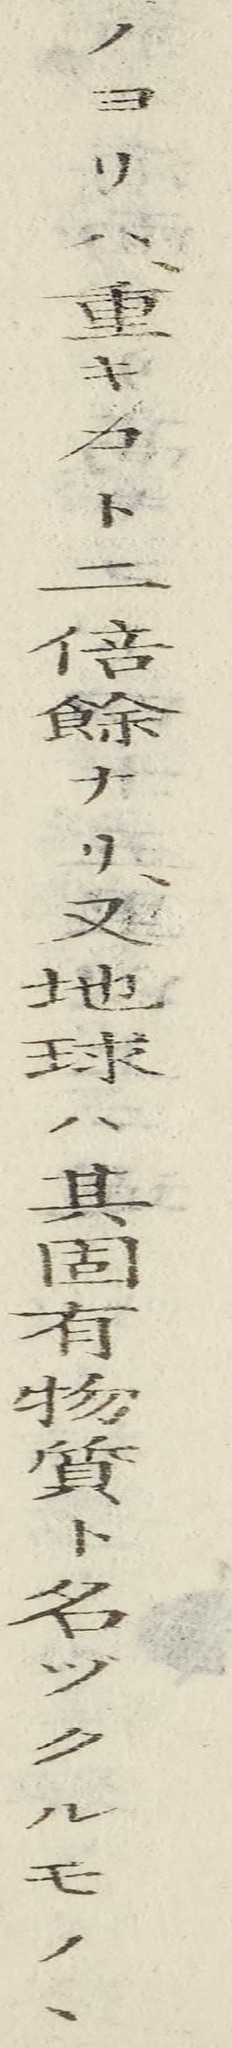ノヨリハ、重キコト二倍余ナリ、又地球ハ其固有物質ト名ツクルモノヽ
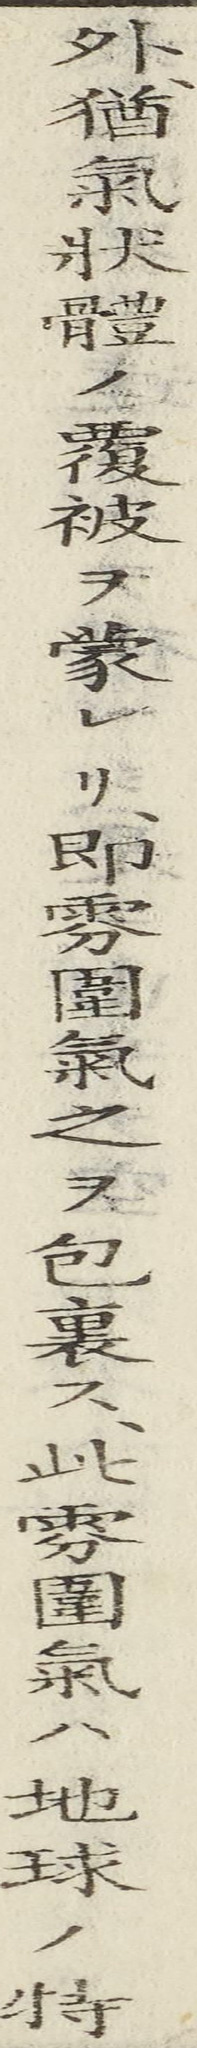外、猶気状体ノ覆被ヲ蒙レリ、即雰囲気之ヲ包裏ス、此雰囲気ハ地球ノ特
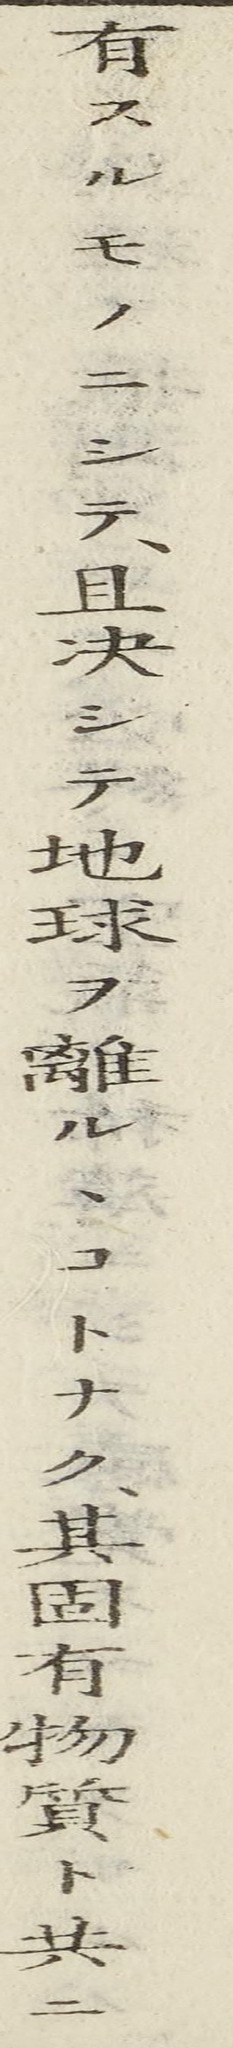有スルモノニシテ、且決シテ地球ヲ離ルヽコトナク、其固有物質ト共ニ
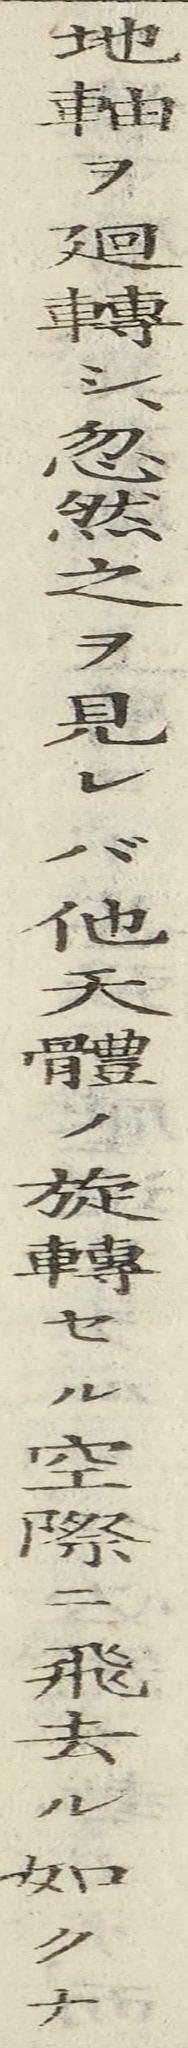地軸ヲ回転シ、忽然之ヲ見レバ他天体ノ旋転セル空際ニ飛去ル如クナ
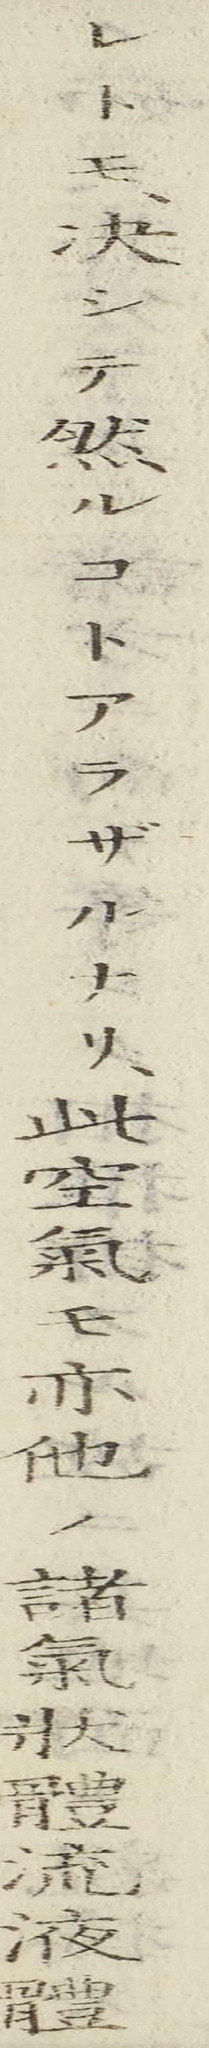レトモ、決シテ然ルコトアラザルナリ、此空気モ亦他ノ諸気状体流液体

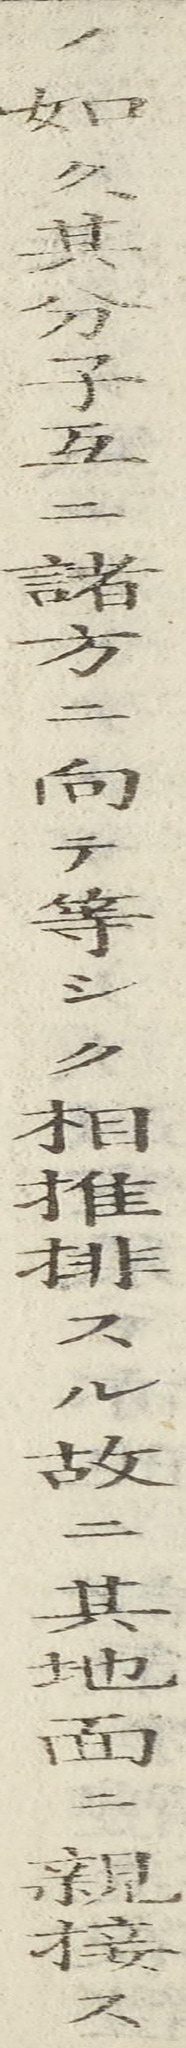ノ如ク、其分子互ニ諸方ニ向テ等シク相推排スル故ニ其地面ニ親接ス
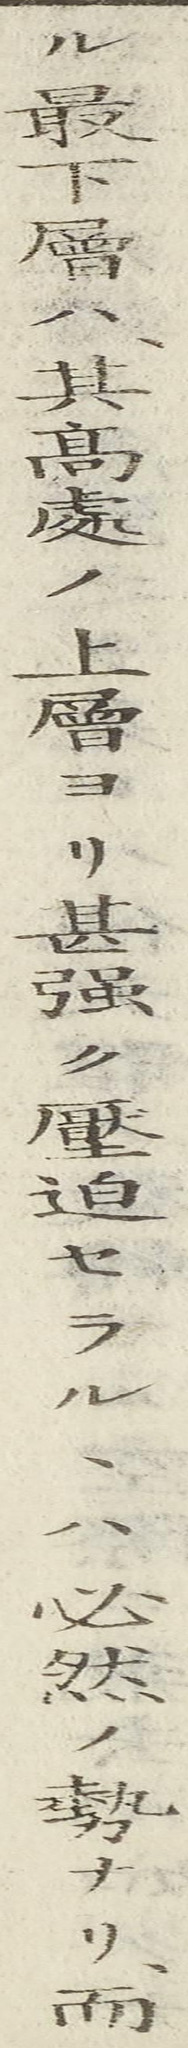ル最下層ハ、其高処ノ上層ヨリ甚強ク圧迫セラルヽハ必然ノ勢ナリ、而
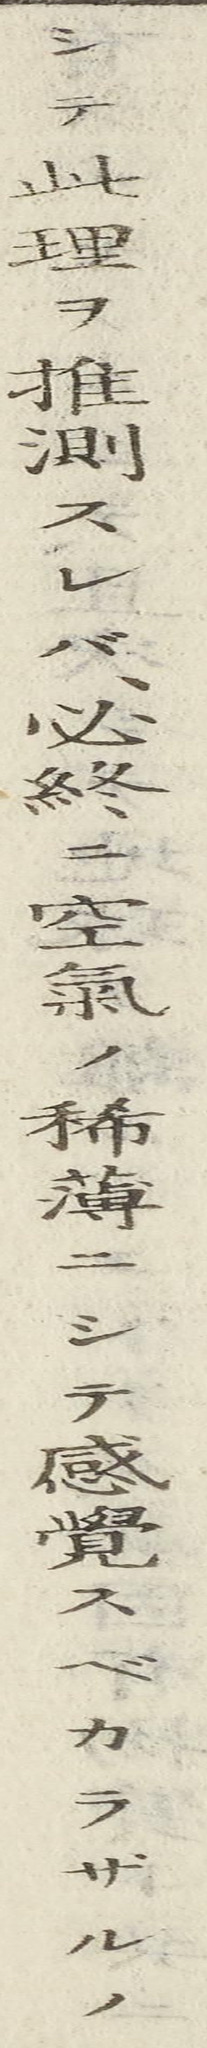シテ此理ヲ推測スレバ、必終ニ空気ノ稀薄ニシテ感覚スベカラザルノ
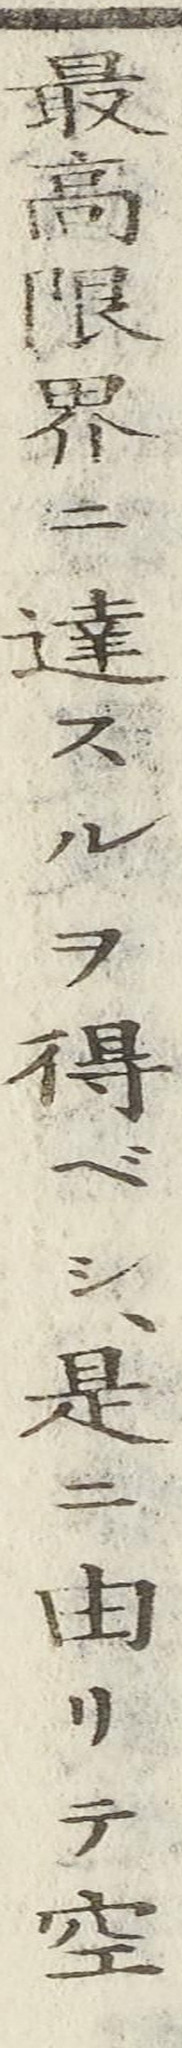最高限界ニ達スルヲ得ベシ、是ニ由リテ空
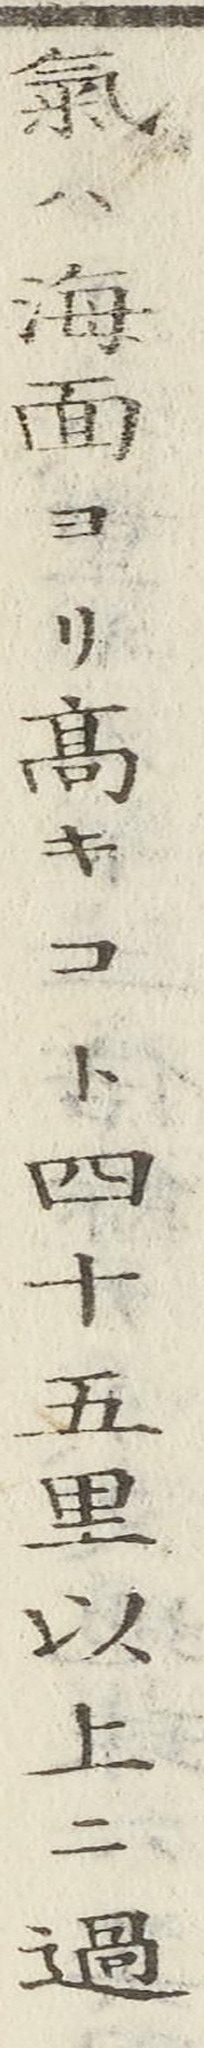気ハ海面ヨリ高キコト四十五里以上ニ過
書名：百科全書　地文學　全
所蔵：東京大学地震研究所図書室 Earthquake Research Institute Library, The University of Tokyo, JAPAN
